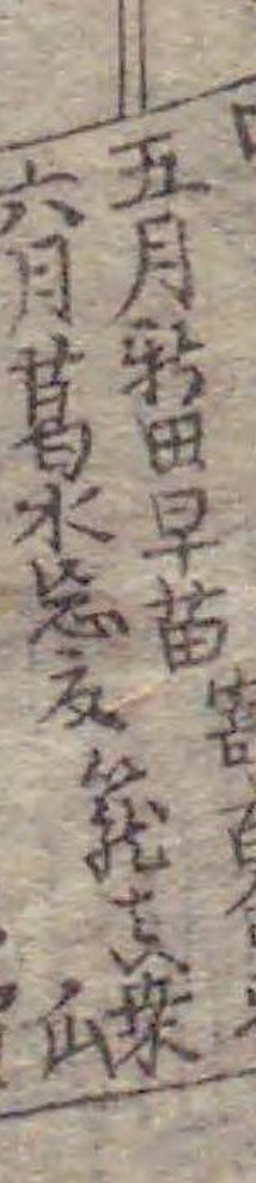六月葛水忘夏籠真桑
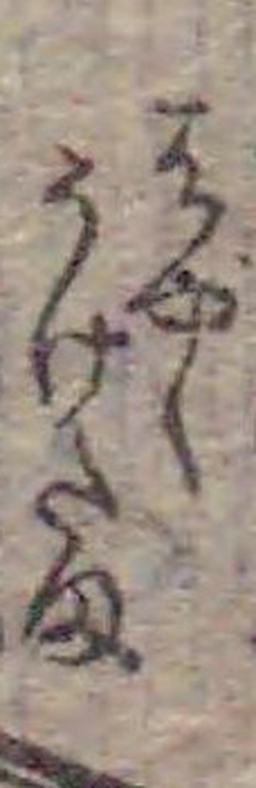うけたま
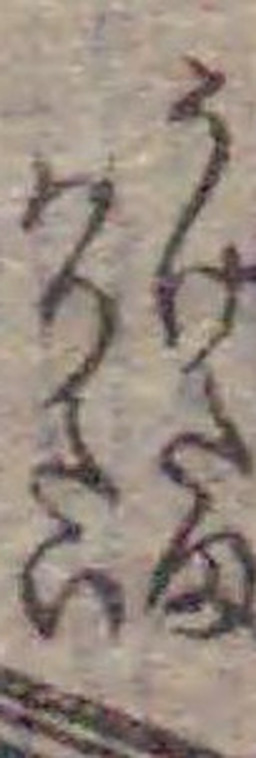はりたい
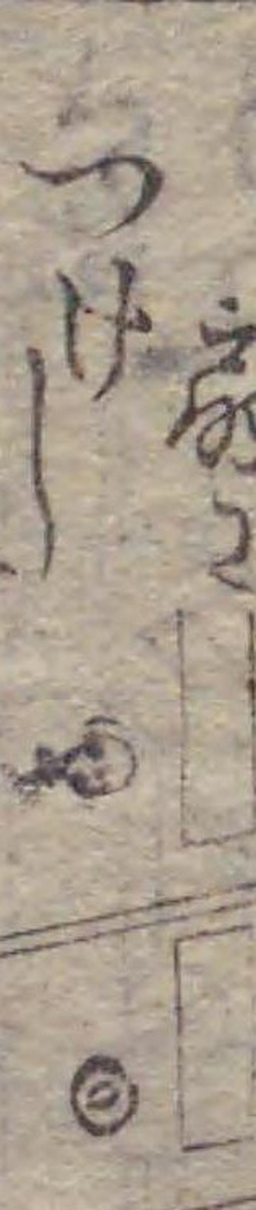つけし
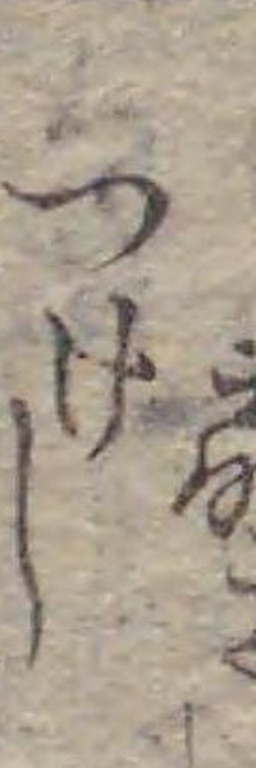つけし
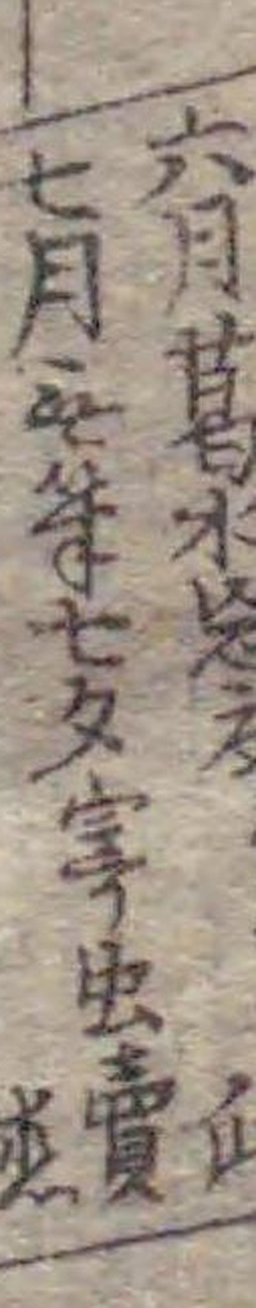七月無筆七夕寄虫売
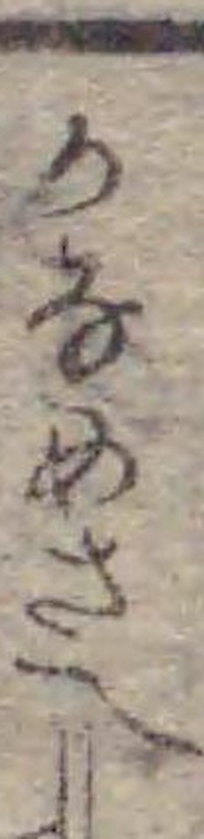かなめさへ
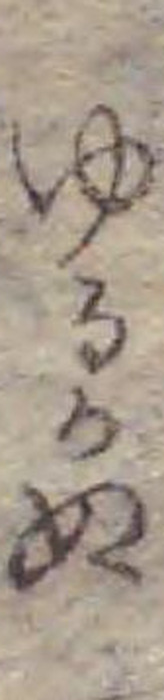ゆるかぬ
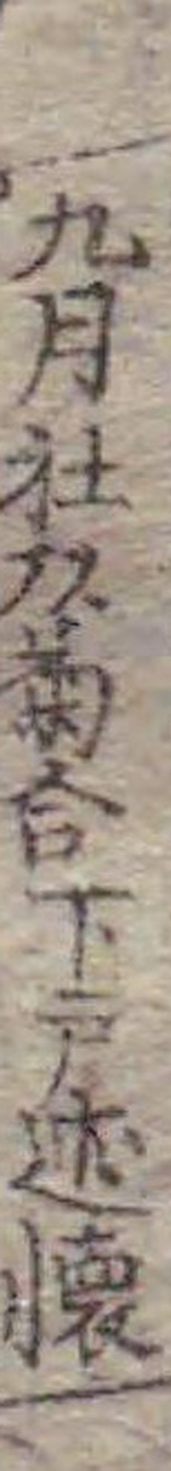九月社頭菊合下戸述懐
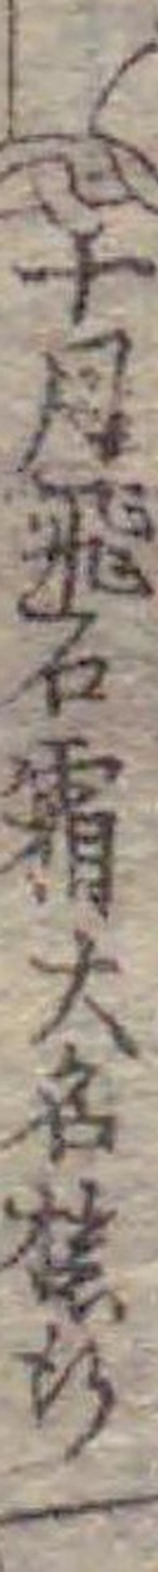十月飛石霜大名旅行
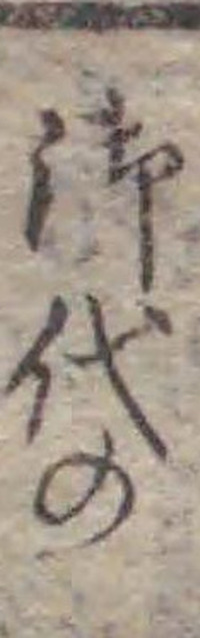御代の
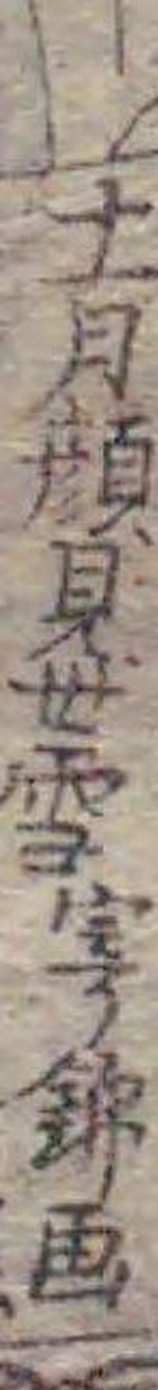十一月顔見世雪寄錦画
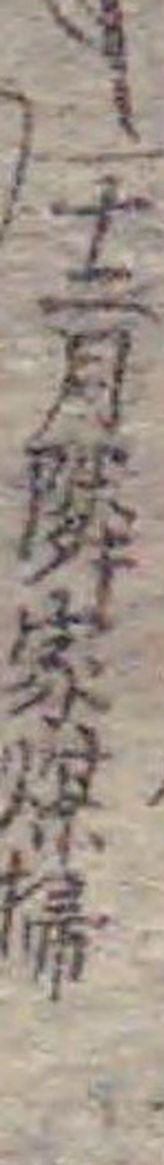十二月隣家煤掃
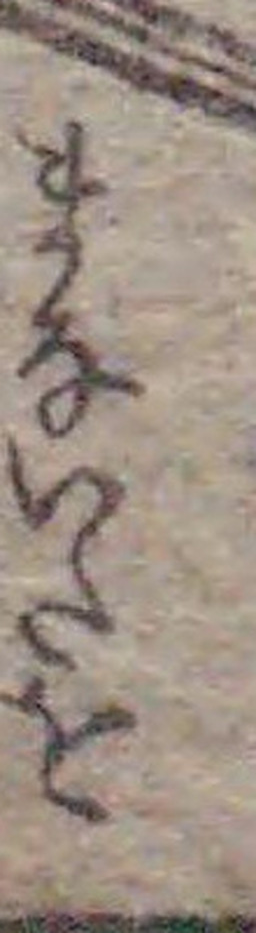まないたを
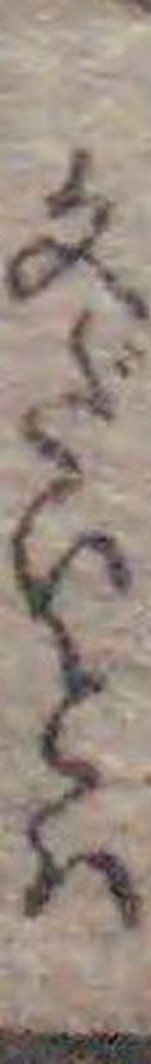文だいとは
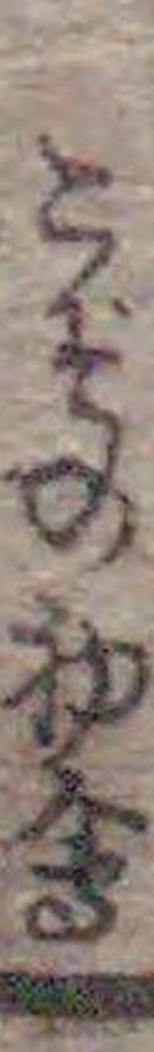こぞの初会
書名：年始御礼帳 : 3巻
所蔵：国立国会図書館 National Diet Library, JAPAN
